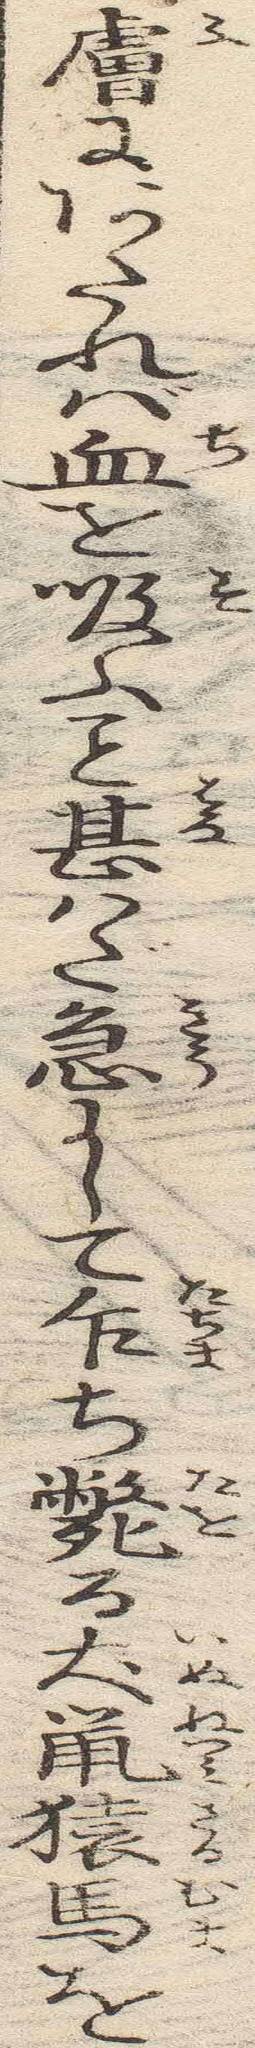膚にあたれば血を吸ふこと甚はだ急にして乍ち斃る犬鼠猿馬を
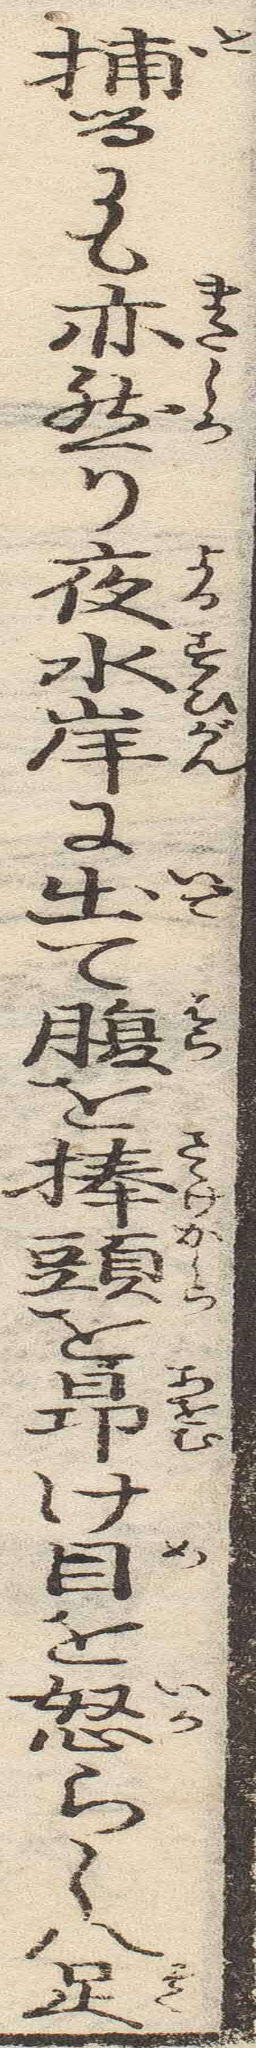捕るにも亦然り夜水岸に出て腹を捧頭を昂け目を怒らし八足
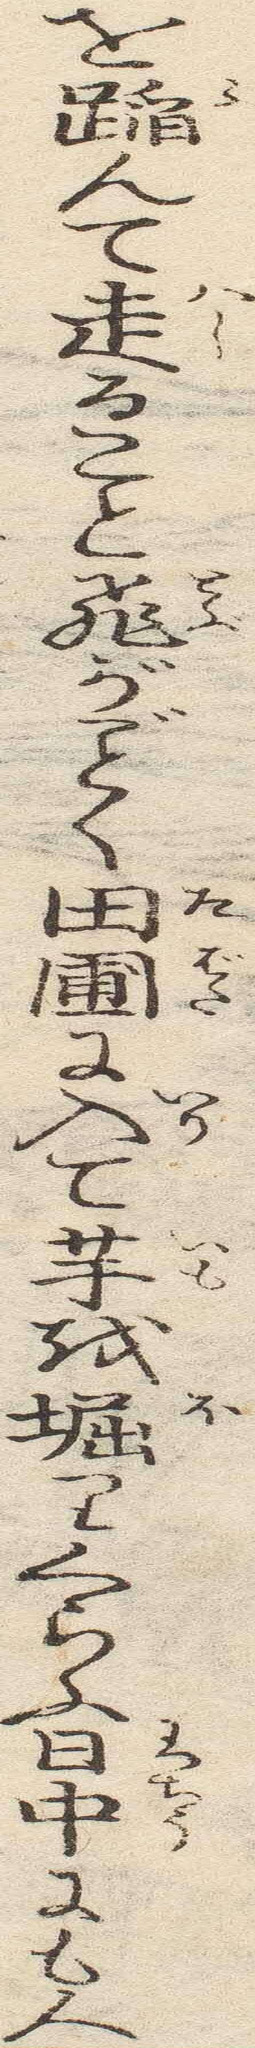を𨂻んて走ること飛がごとく田圃に入て芋を堀りくらふ日中にも人
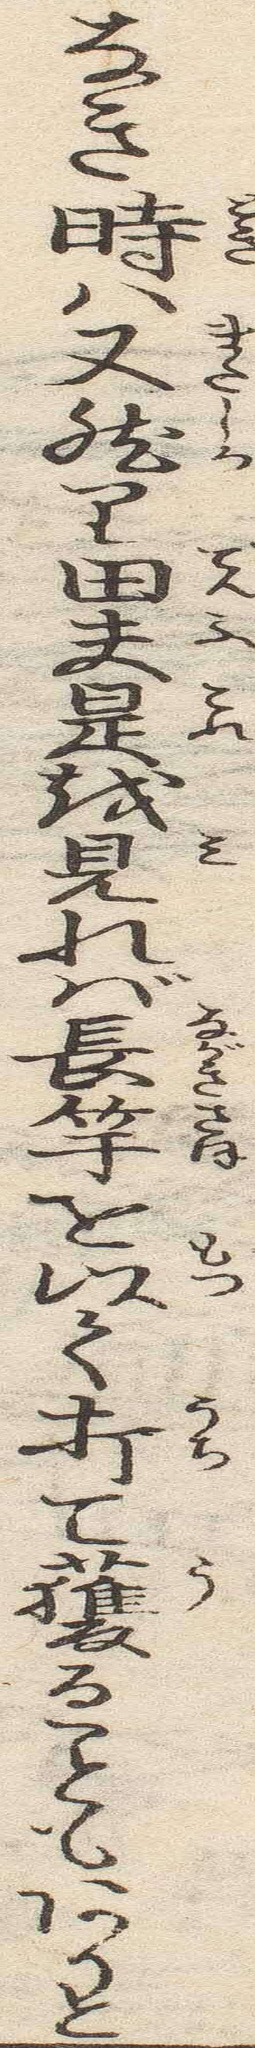なき時は又然り田夫是を見れば長竿を以て打て獲ることもありと
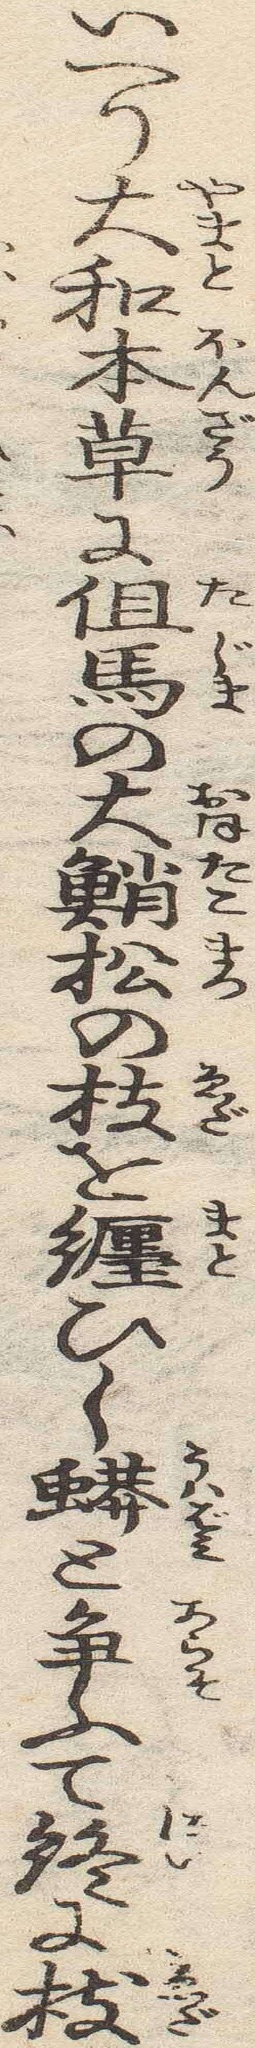いへり大和本草に但馬の大鮹松の枝を纏ひし蟒と争ふて終に枝
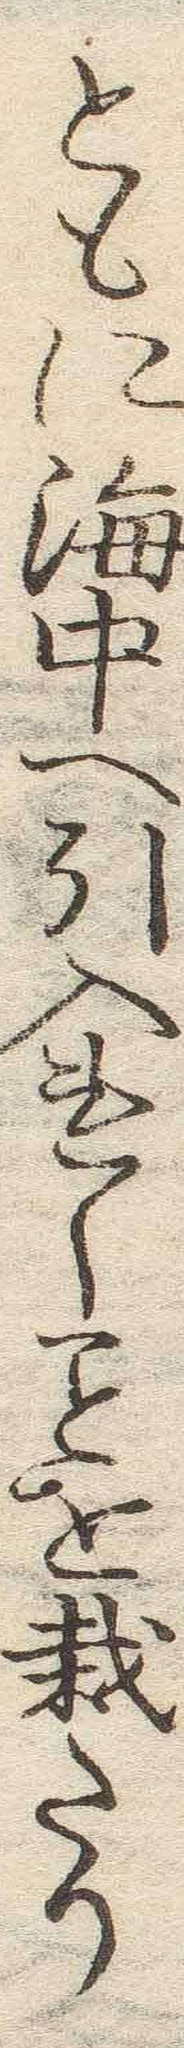ともに海中へ引入れてことを載たり
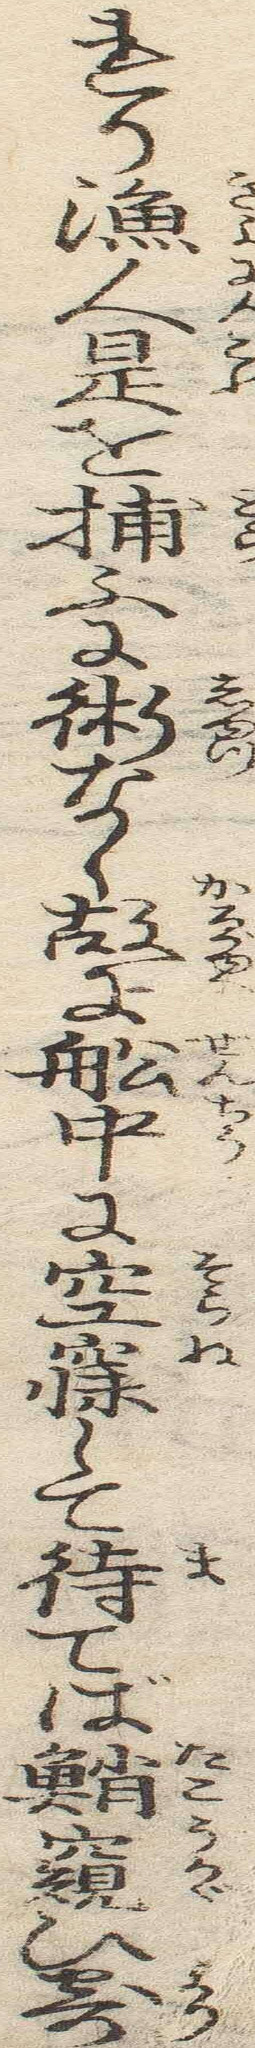れり漁人是を捕ふに術なし故に船中に空寐して待てば鮹窺ひ寄
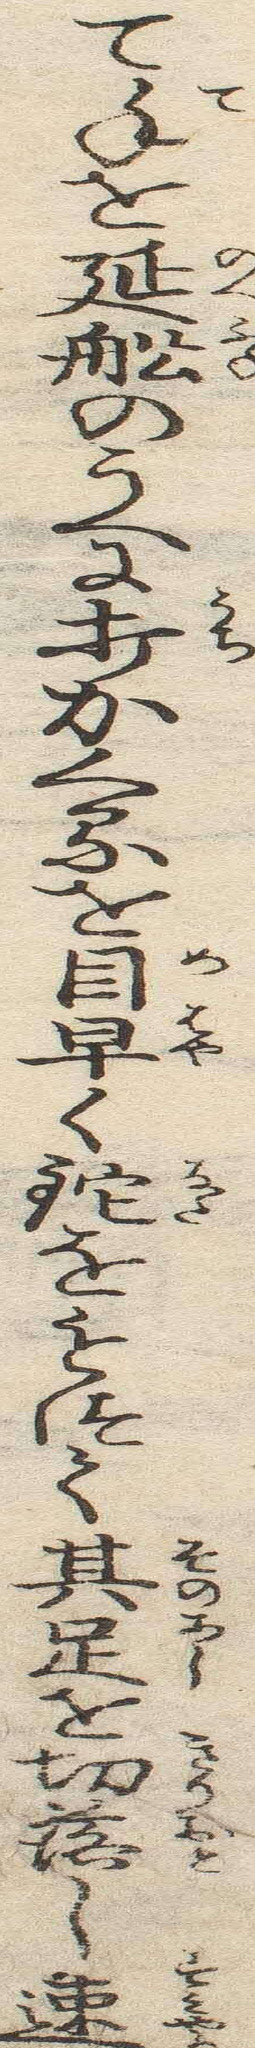て手を延船のうへに打かくるを目早く鉈をもつて其足を切落し速
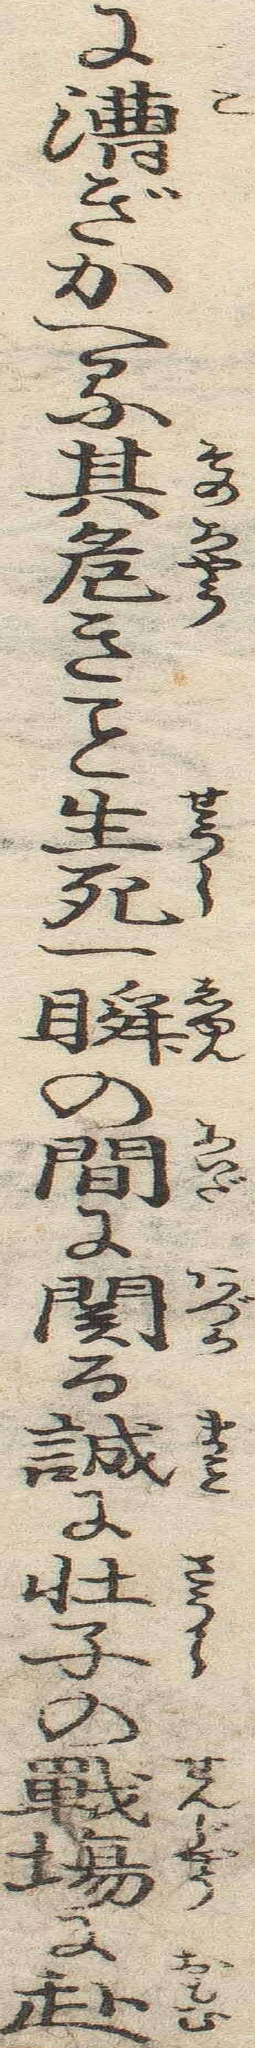に漕ぎかへる其危きこと生死一瞬の間に関る誠に壮士の戦場に赴
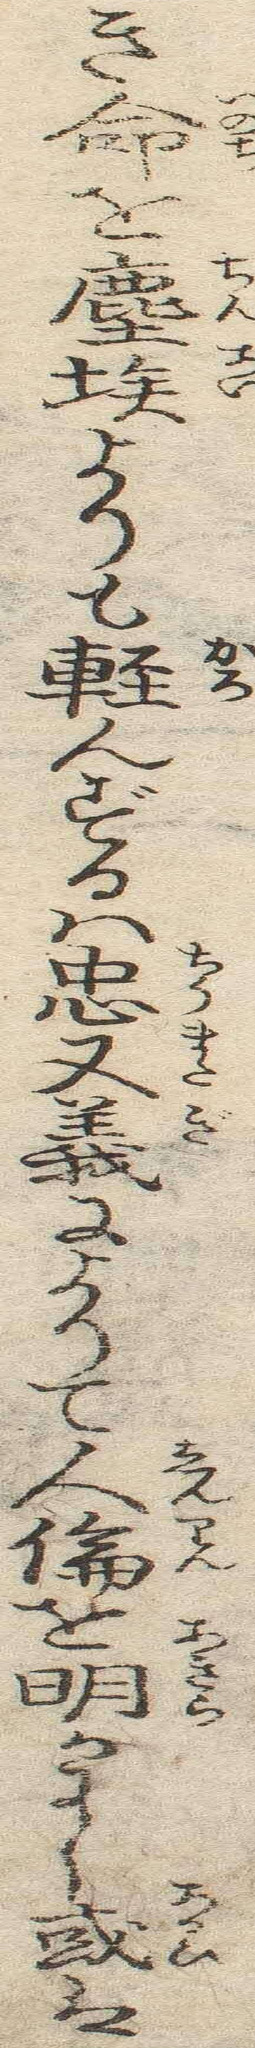き命を塵埃よりも軽んずるは忠又義によりて人倫を明かにし或は
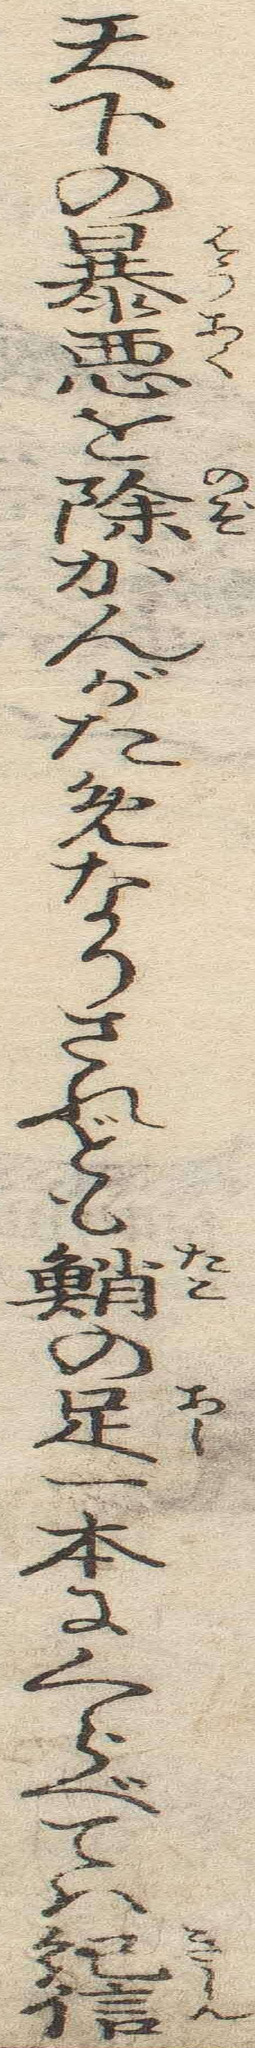天下の暴悪を除かんがためなりされども鮹の足一本にくらべては紀信
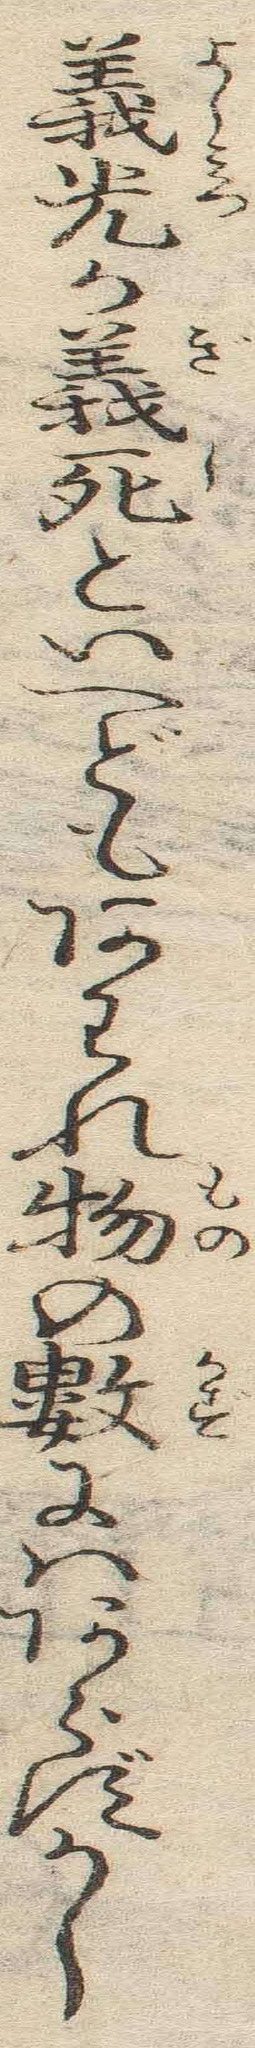義光か義死といへどもあわれ物の数にはあらずかし
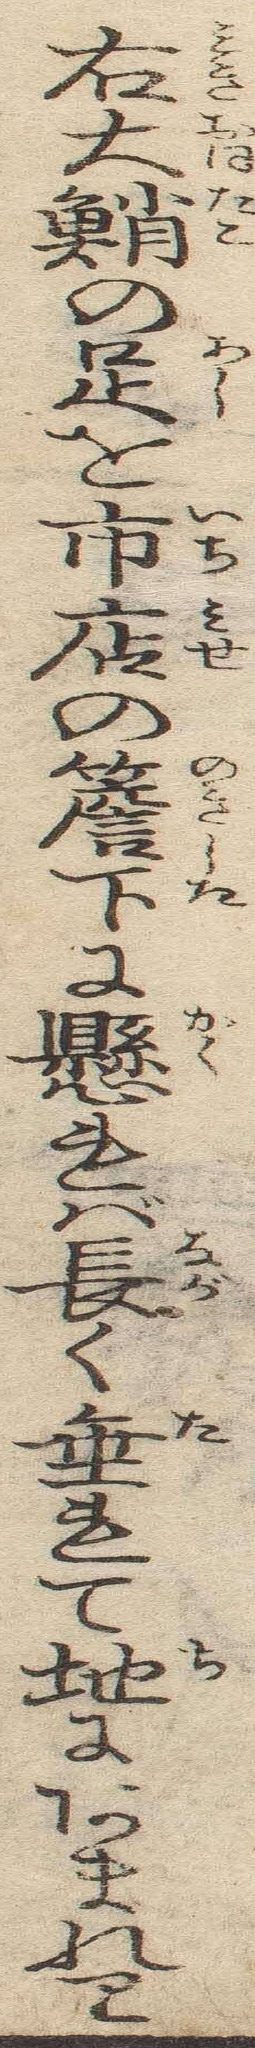右大鮹の足を市店の簷下に懸れば長く垂れて地にあまれり

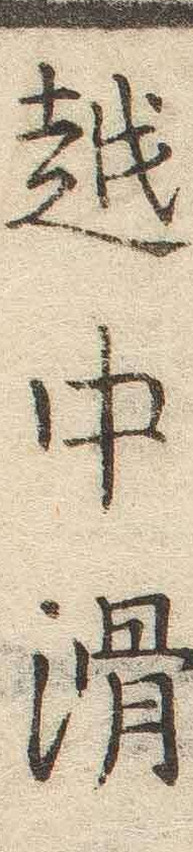越中滑

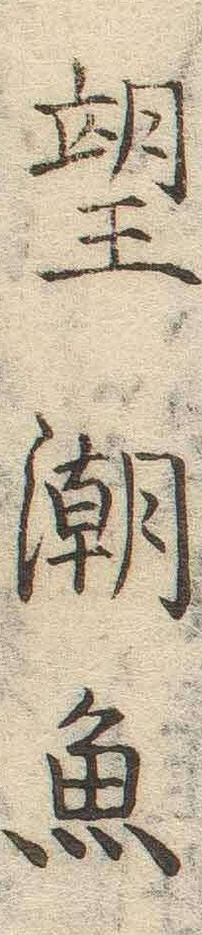望潮魚
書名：日本山海名産図会
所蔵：東京学芸大学附属図書館 国文学研究資料館
